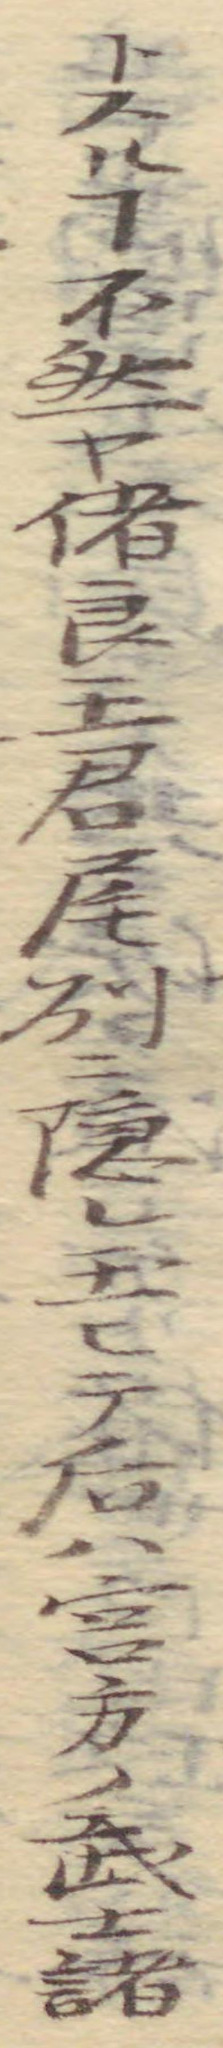トスルコト不然ヤ偖良王君尾州ニ隠レ玉ヒテ后ハ宮方ノ武士諸
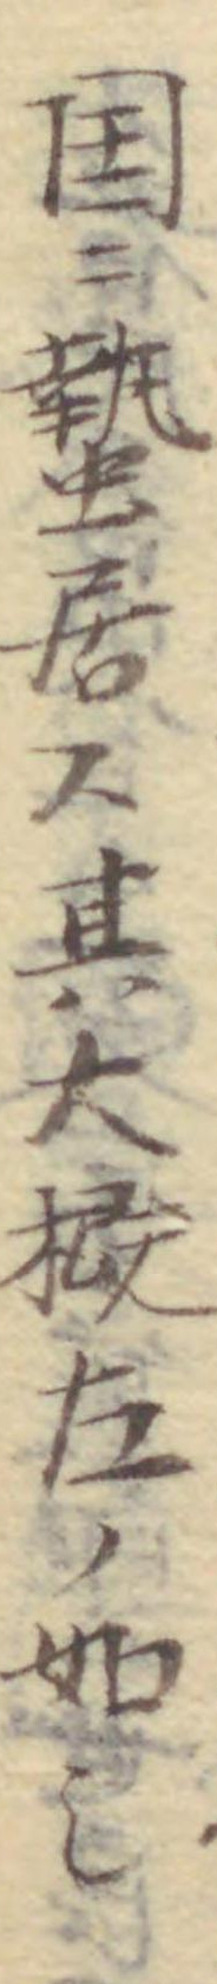国ニ蟄居ス其大概左ノ如シ
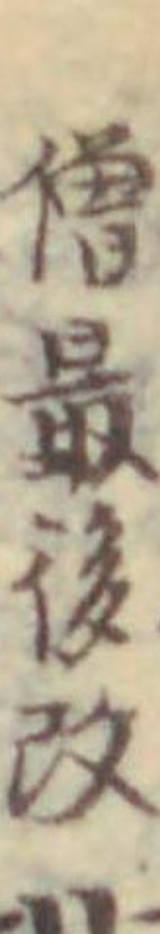僧最後改
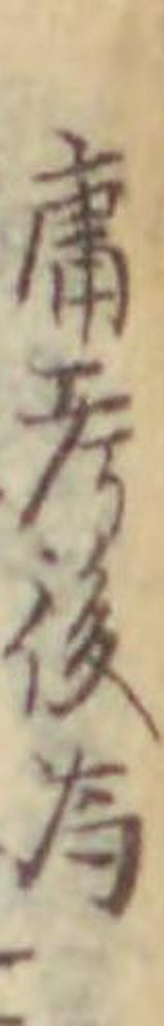庸考後為
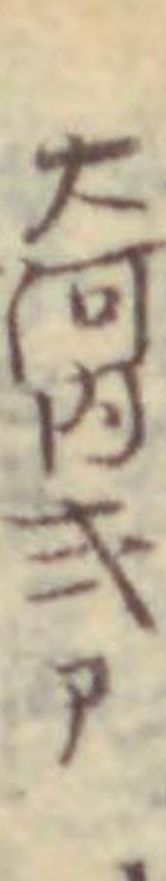大河内式部
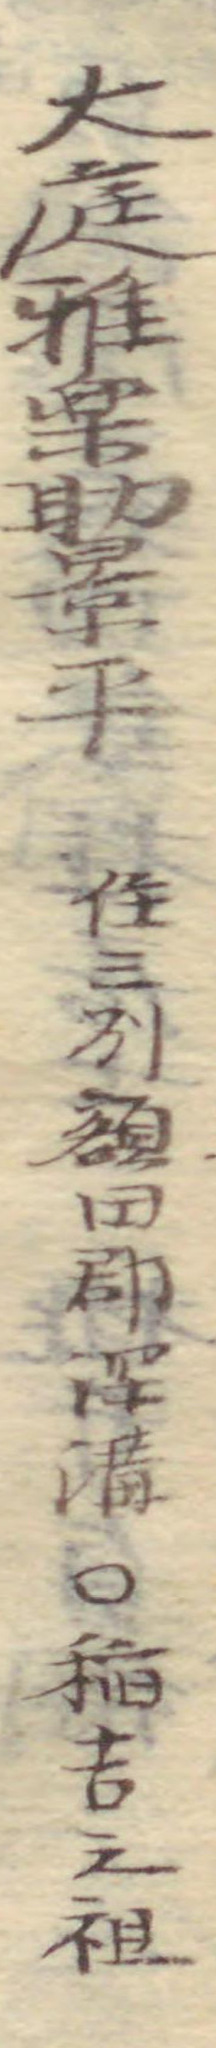大庭雅楽助景平住三州額田郡深溝〇稲吉之祖
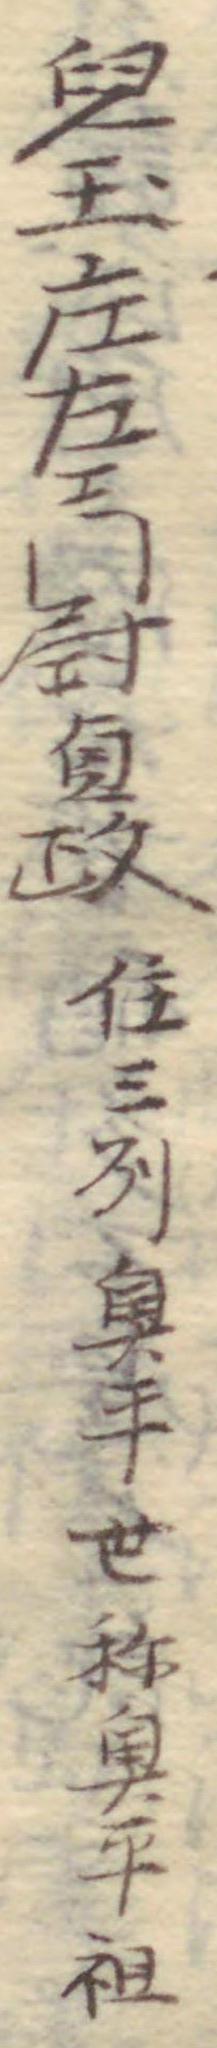児玉庄左エ門尉貞政住三州奥平世称奥平祖
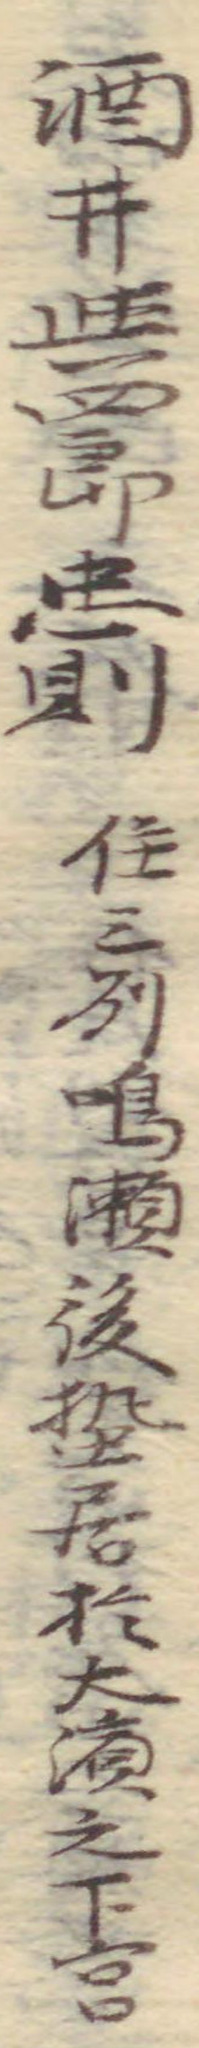酒井與四郎忠則住三州鳴瀬後蟄居於大濱之下宮
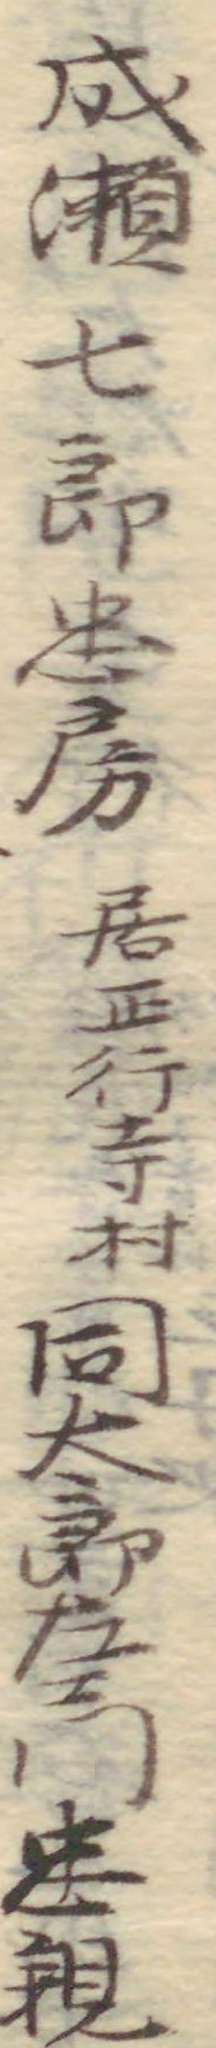成瀬七郎忠房居正行寺村同太郎左エ門忠親
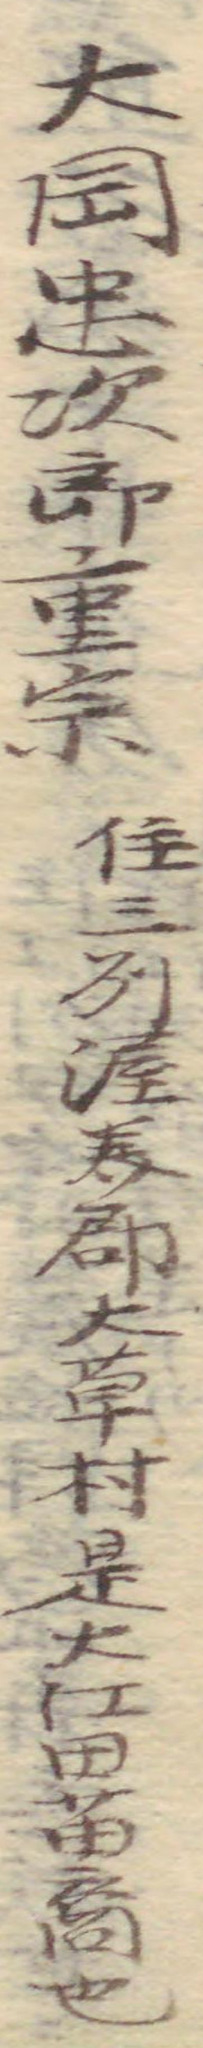大岡忠次郎重宗住三州渥美郡大草村是大江田苗裔也
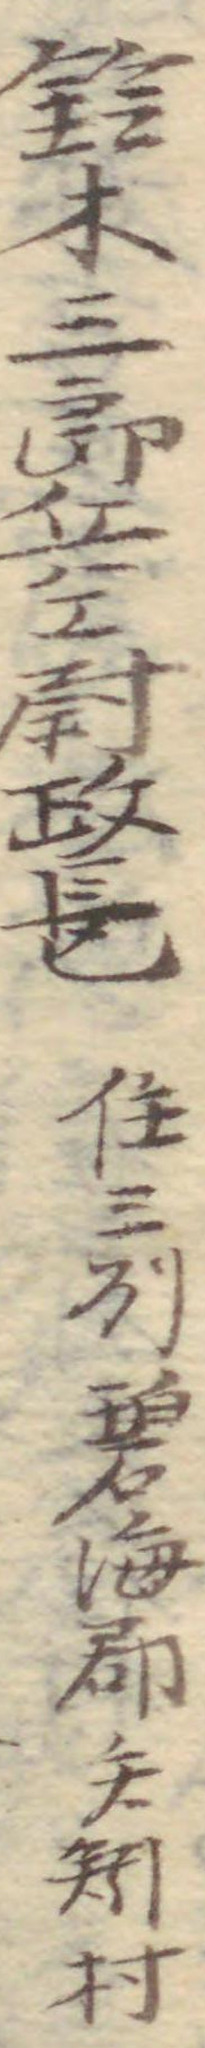鈴木三郎兵エ尉政長住三州碧海郡矢矧村
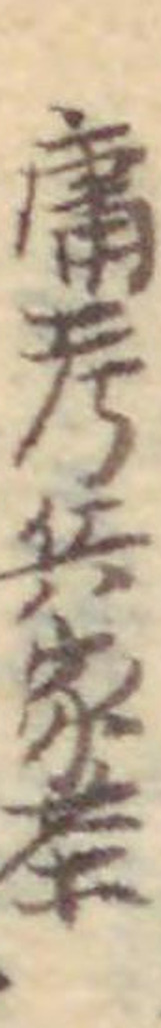庸考兵家茶
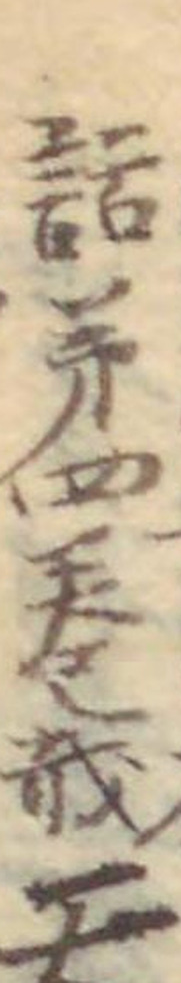話第四巻載
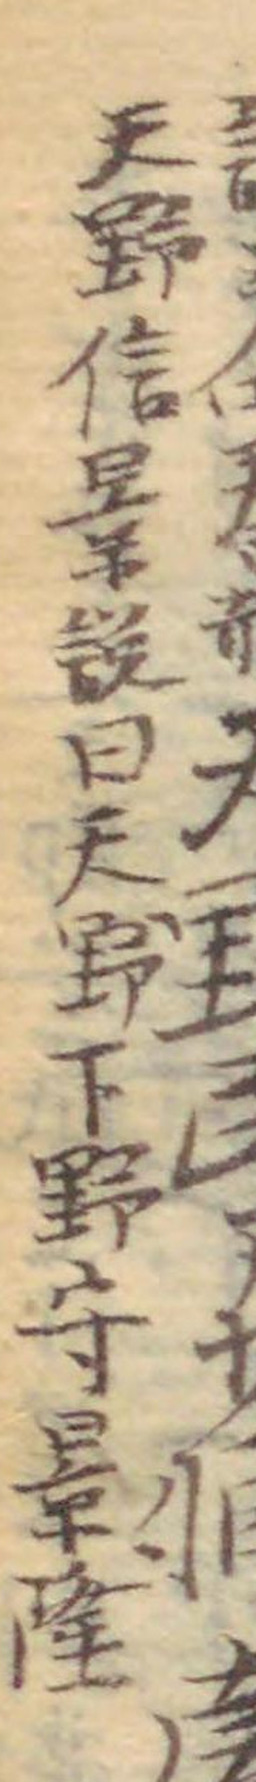天野信景説曰天野下野守景隆
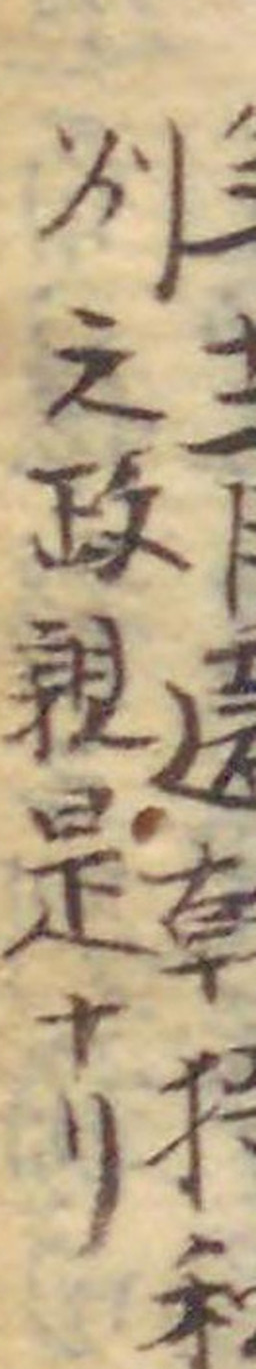州元政親是ナリ

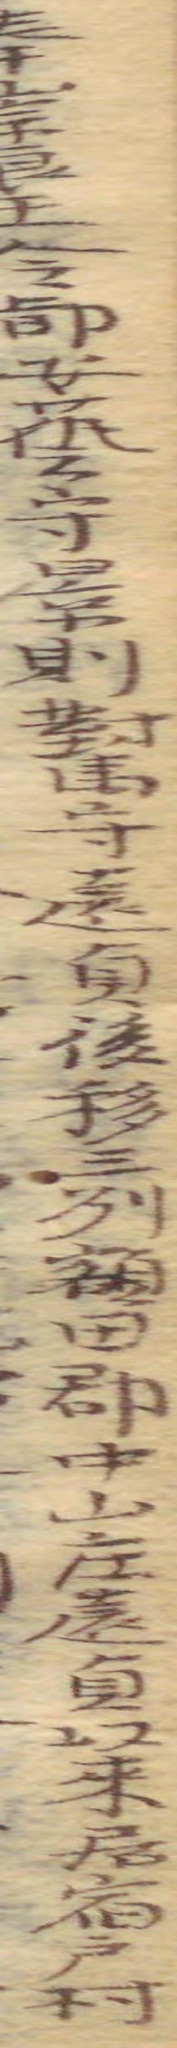奉崇良王令安芸守景則対馬守遠貞後移三州額田郡中山庄遠貞以来居宿戸村
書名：鶯宿雑記. 巻199-200
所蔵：国立国会図書館 National Diet Library, JAPAN
